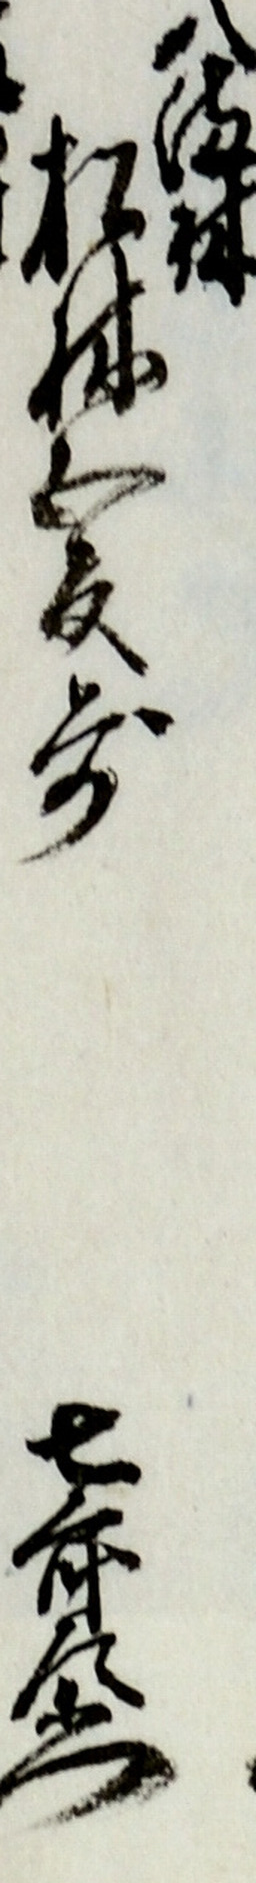松林五反歩七郎左衛門
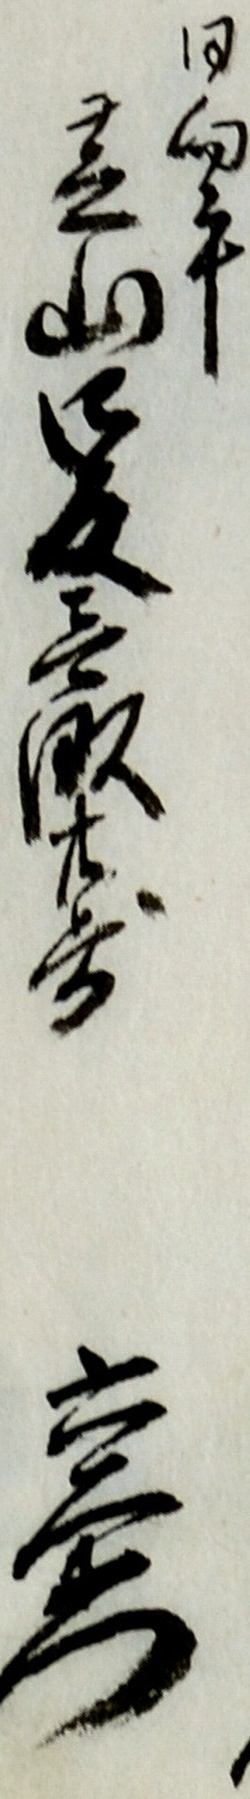芝山四反壱畝廿歩六右衛門

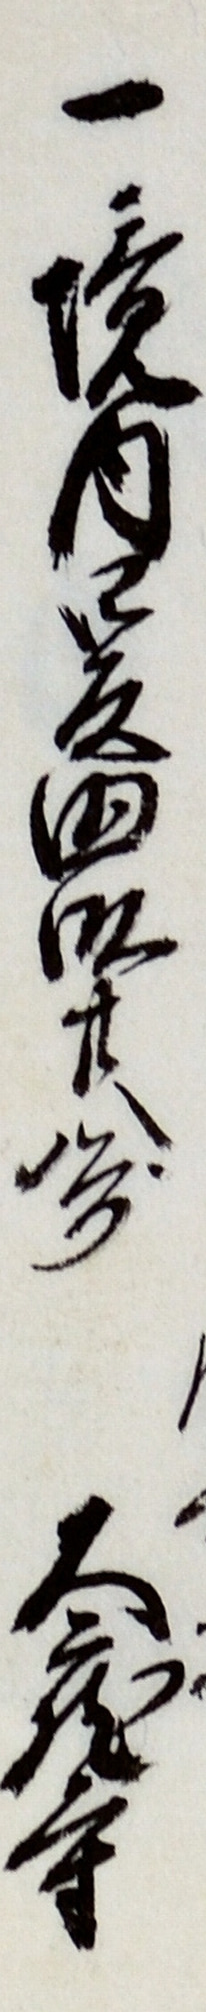一境内四反四畝廿八歩大蔵寺
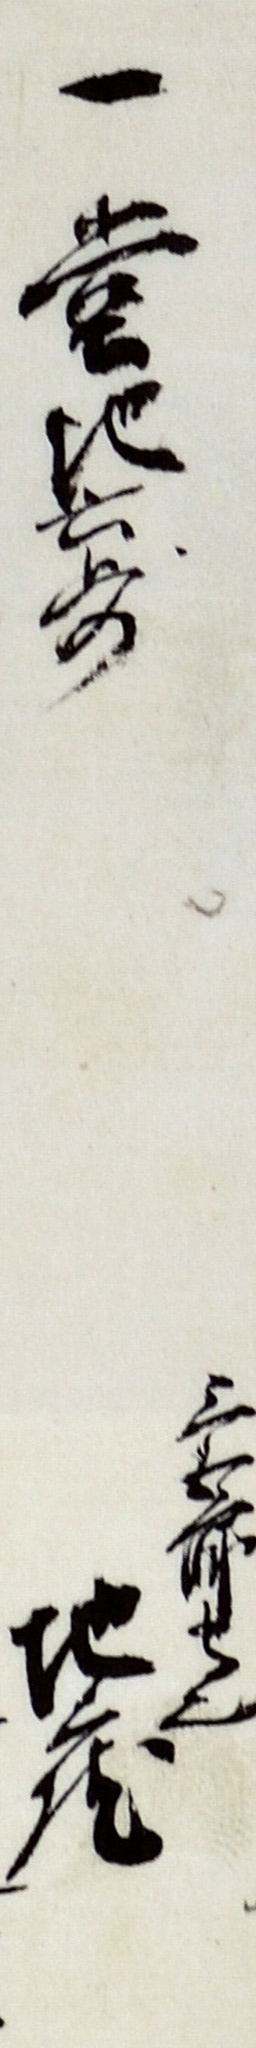一堂地六歩地蔵
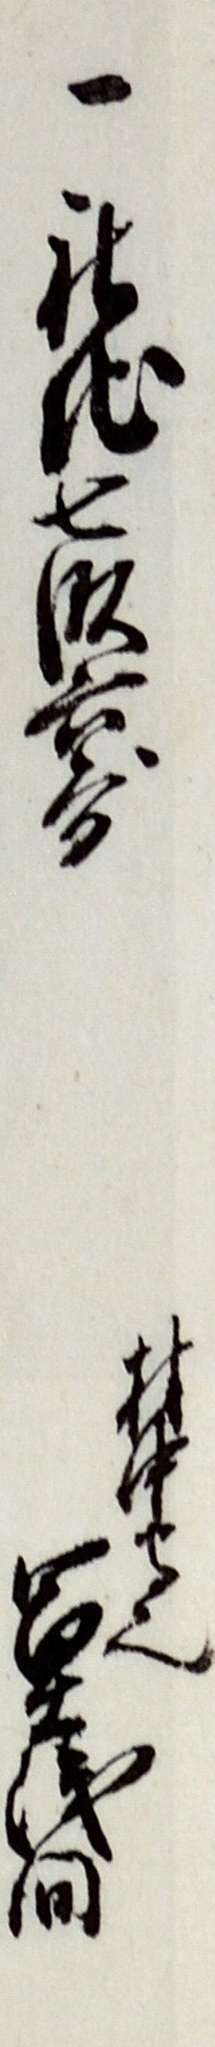一社地七畝六歩富士浅間
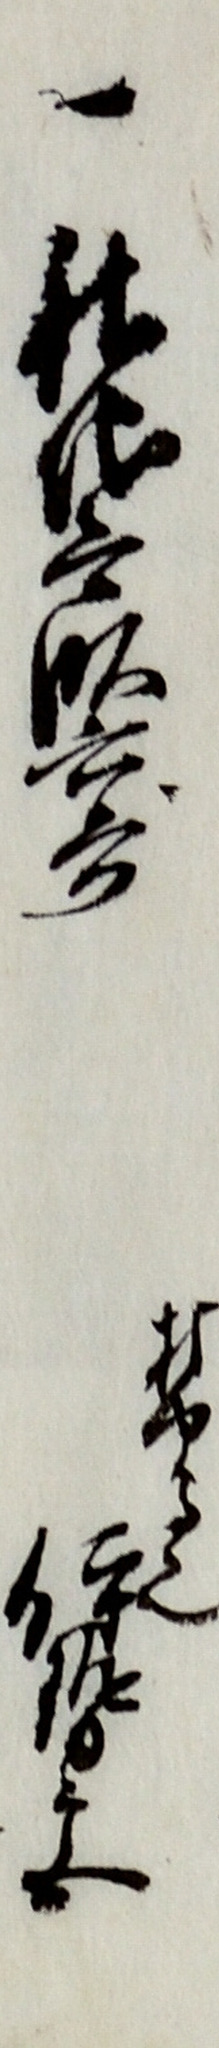一社地壱畝六歩伊勢宮
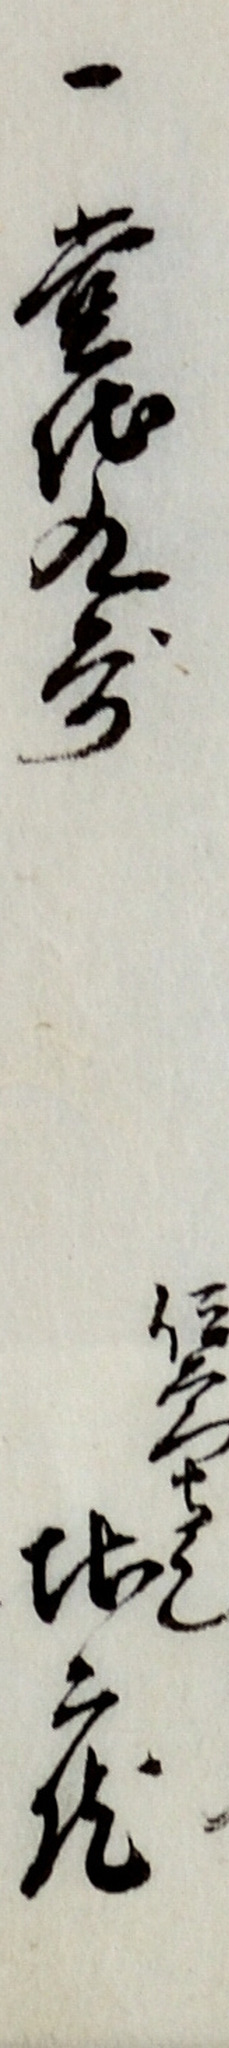一堂地九歩地蔵
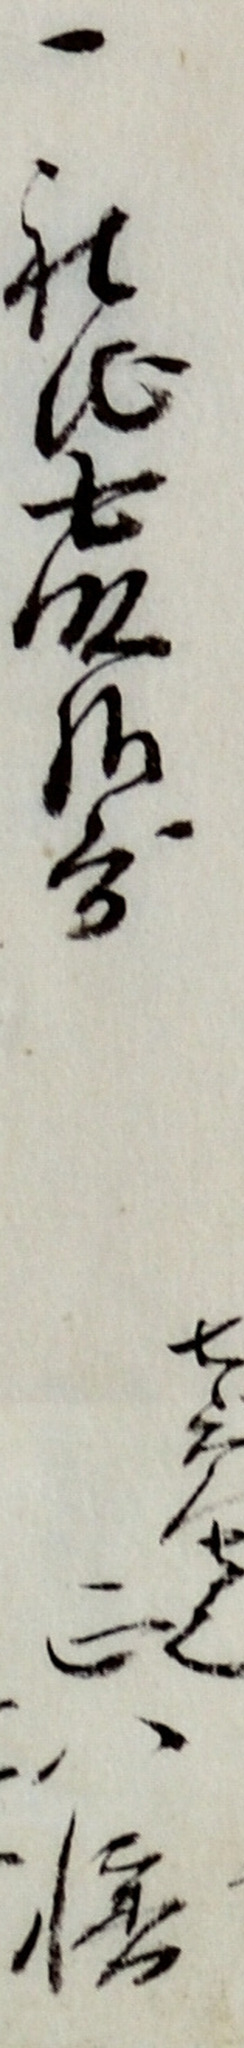一社地七畝拾歩正八幡

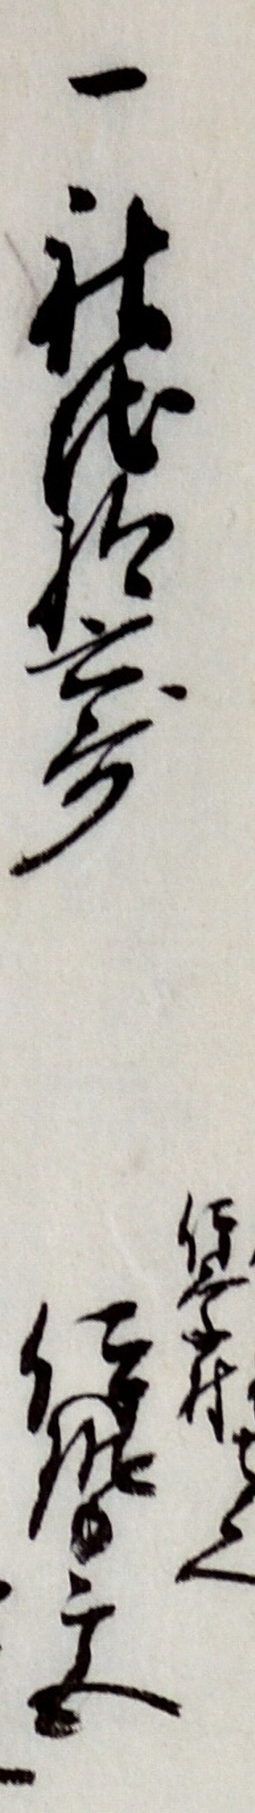一社地拾六歩伊勢宮
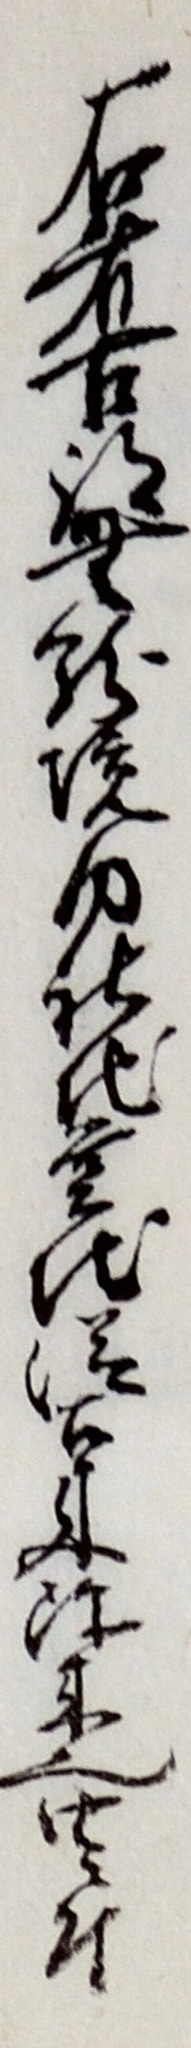右者古跡無粉境内社地堂地従古来除来也由ニ付
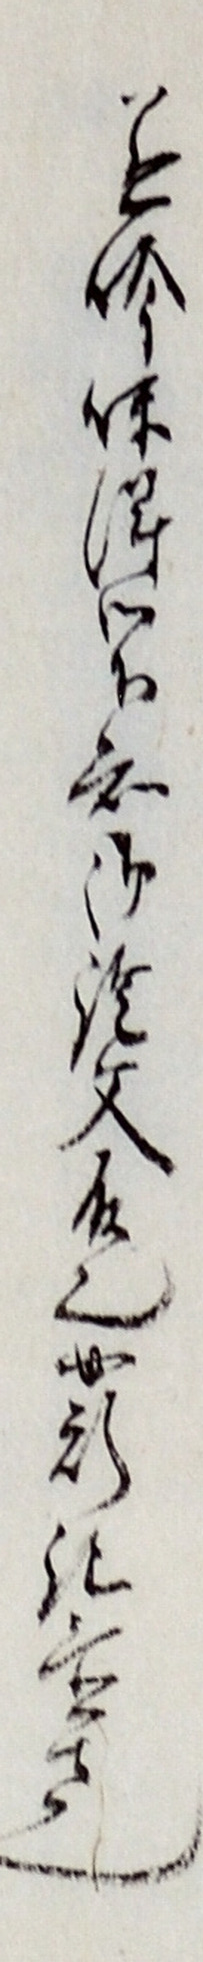進吟味得御下知御証文取之如斯記置者也
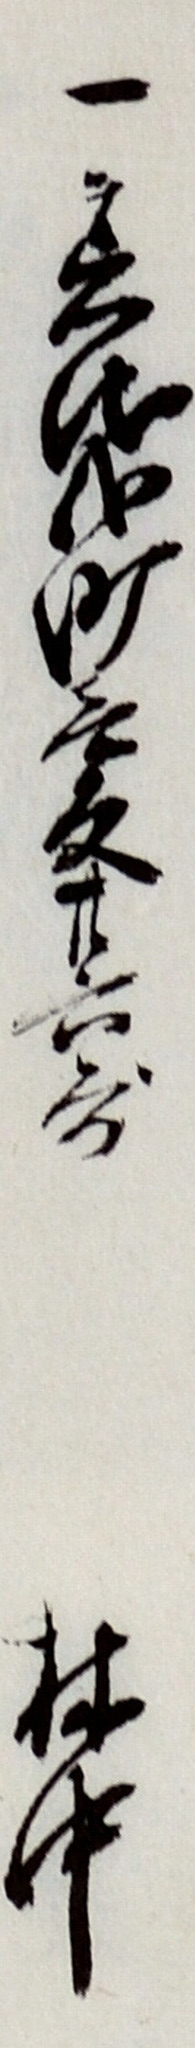一荒地弐町壱反廿六歩村中
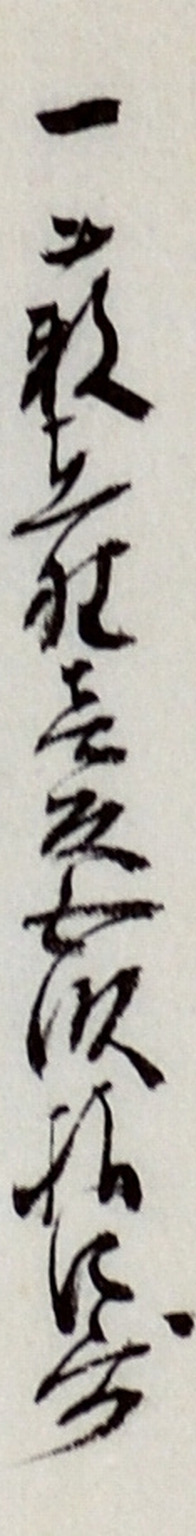一散在野壱反七畝拾四歩
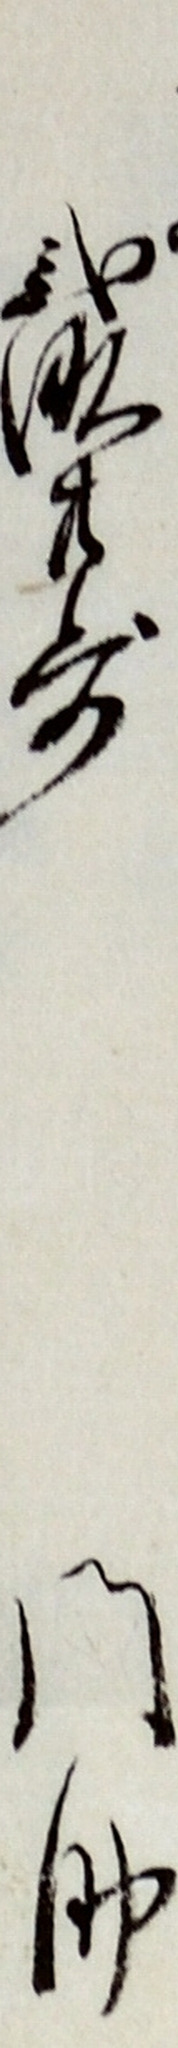弐畝廿歩門助
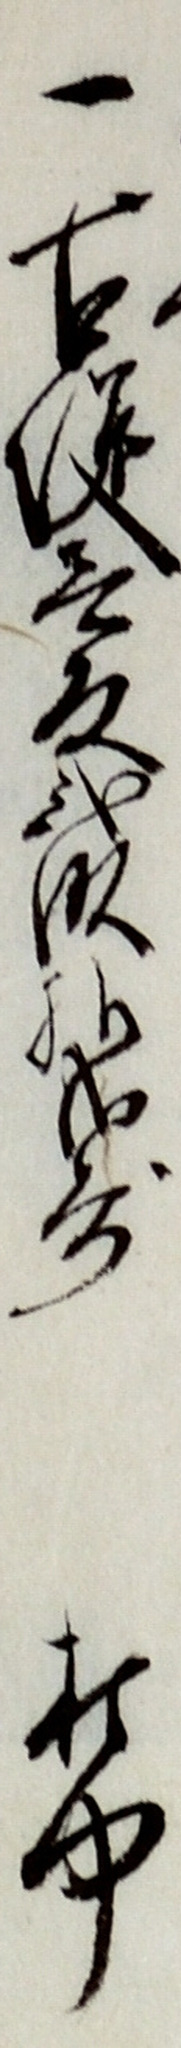一古堤壱反弐畝拾弐歩村中
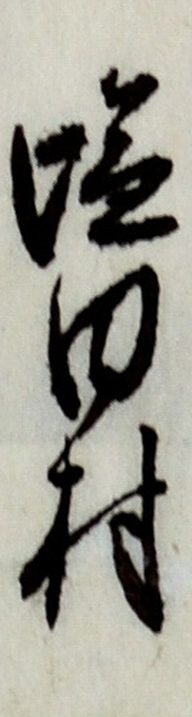塩田村
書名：御領分中山林社地手控
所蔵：伊那市立高遠町図書館・合同会社AMANE
